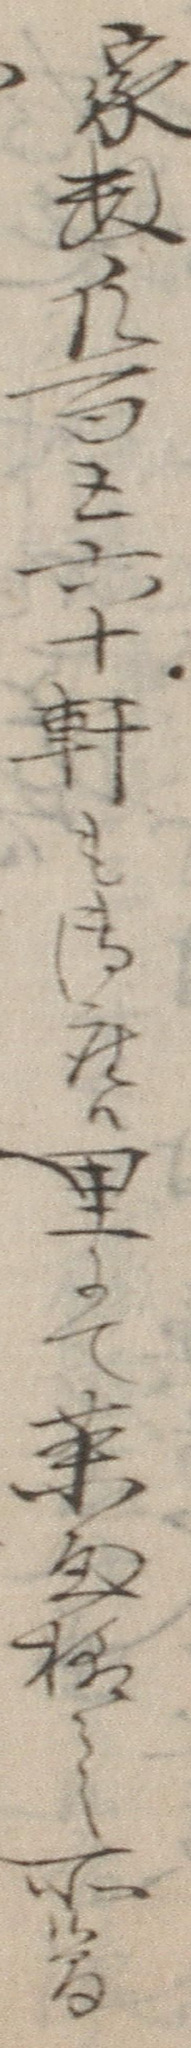家数凡百五六十軒も御座候里にて薬屋様之所候間を
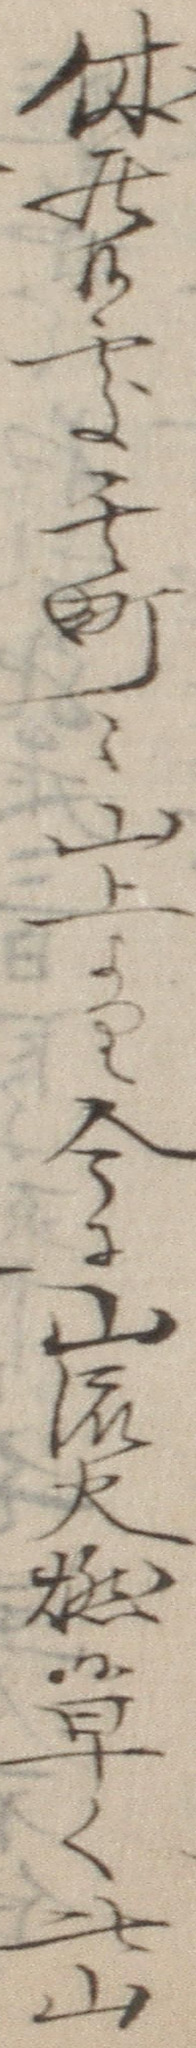休居候処其町々山上より今に山流火燃候早く此山
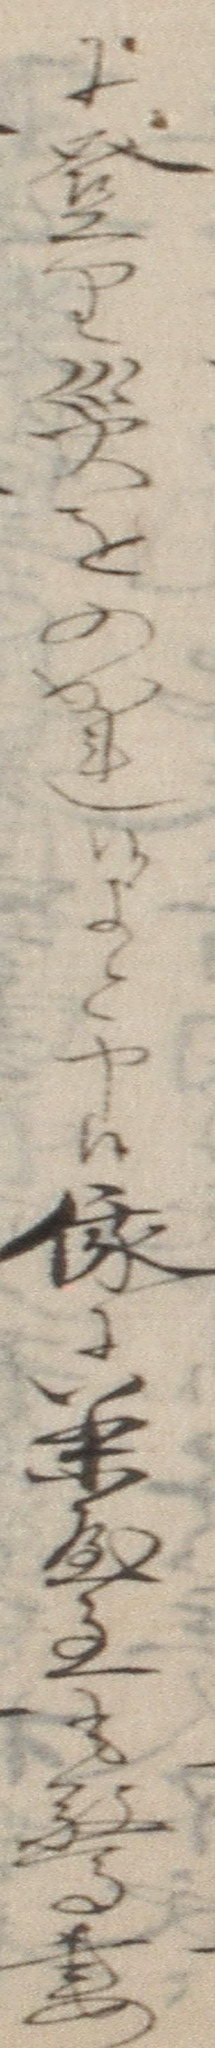に登り災をのかれ候よと申候俄に薬屋主も驚妻
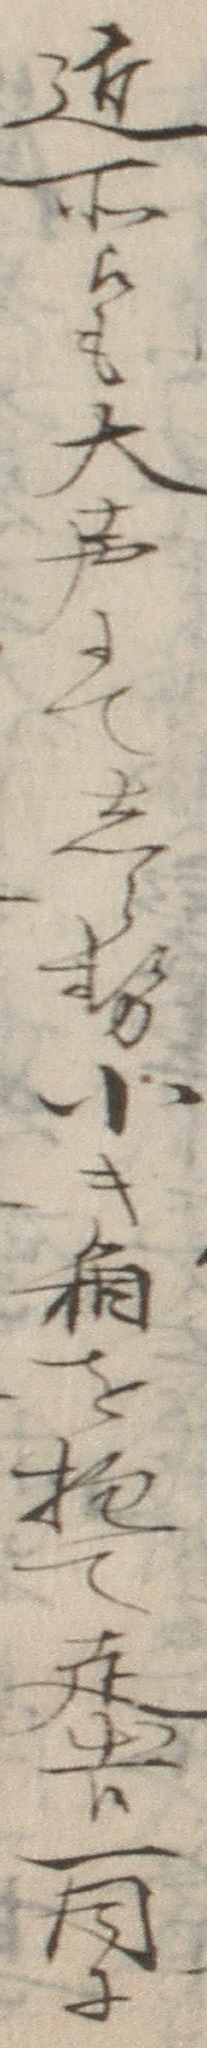近所えも大声にてしらせ小キ箱を抱て走出候一同に
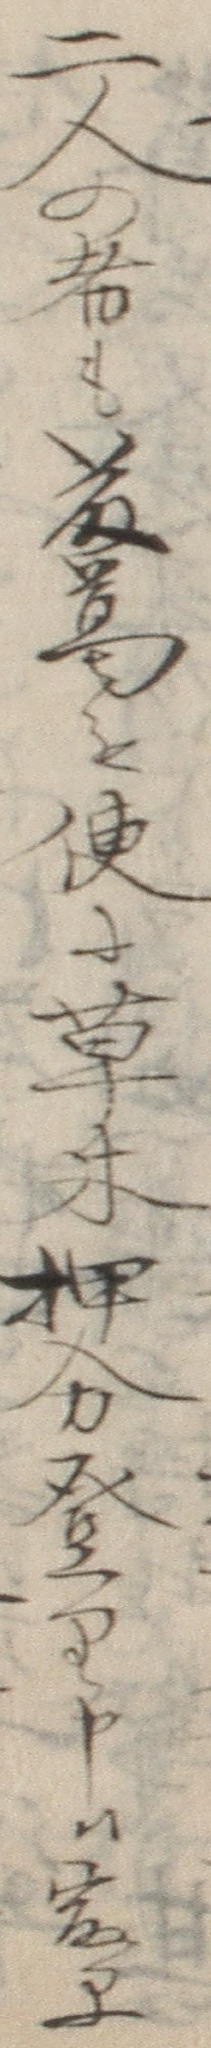二人の者も藤葛を便に草木押分登り申候最早
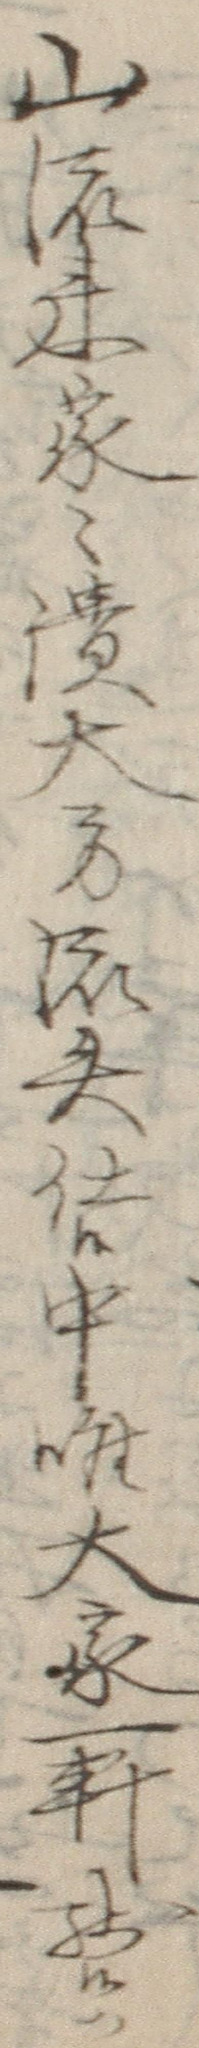山流来家々潰大方流失仕候中唯大家一軒残候
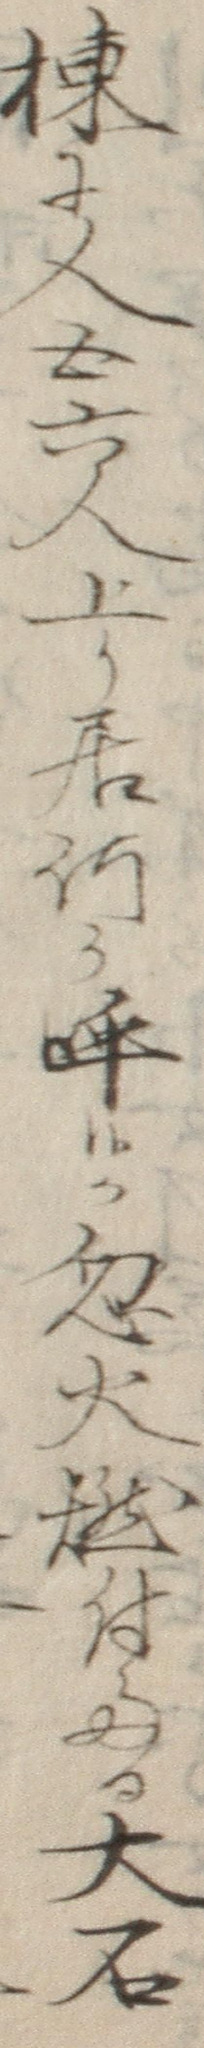棟に人五六人上り居何か呼候か忽火燃付たる大石
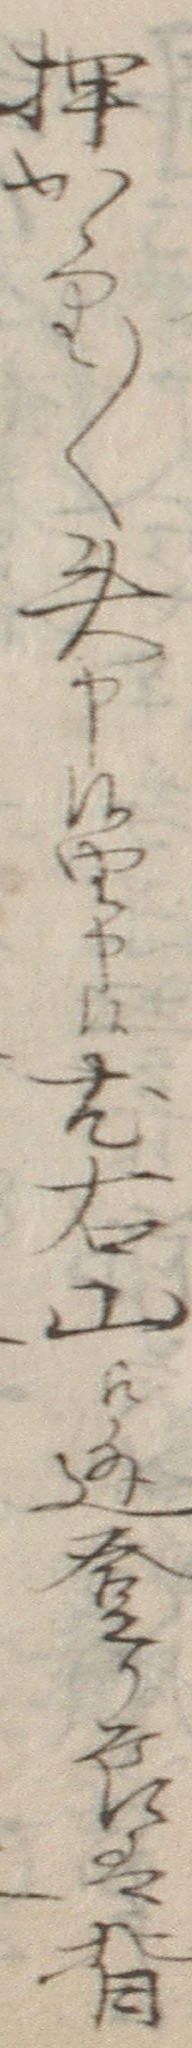押かゝり〳〵失申候由申候尤右山え逃登り節は背
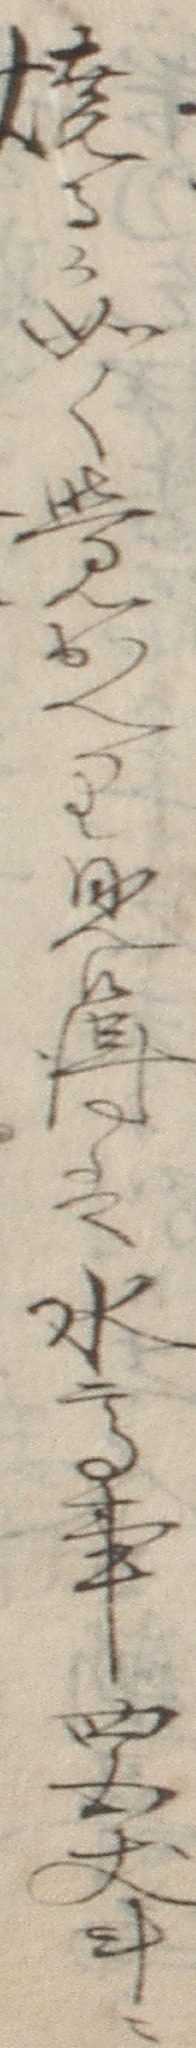燃るか如く覚かへり見候得は水高事四五丈斗ニ
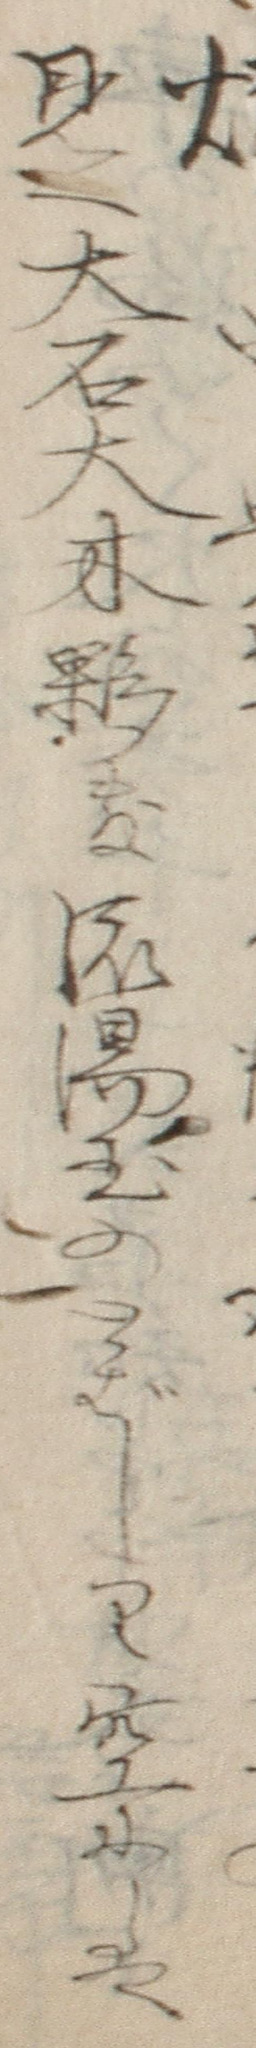見へ火石大木夥敷流湯玉のとばしり空には

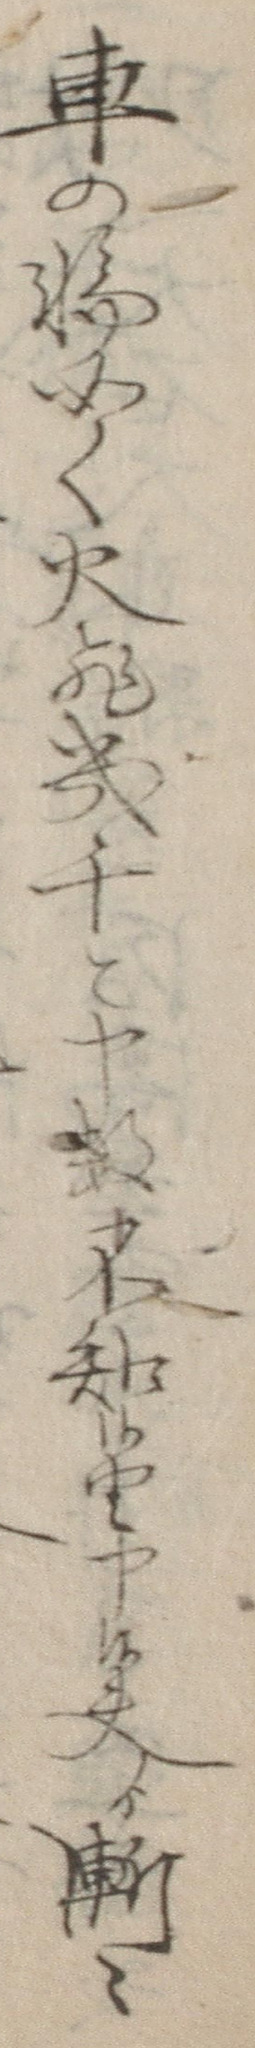車の輪如く火飛幾千と申数不知候由申候夫ゟ漸々
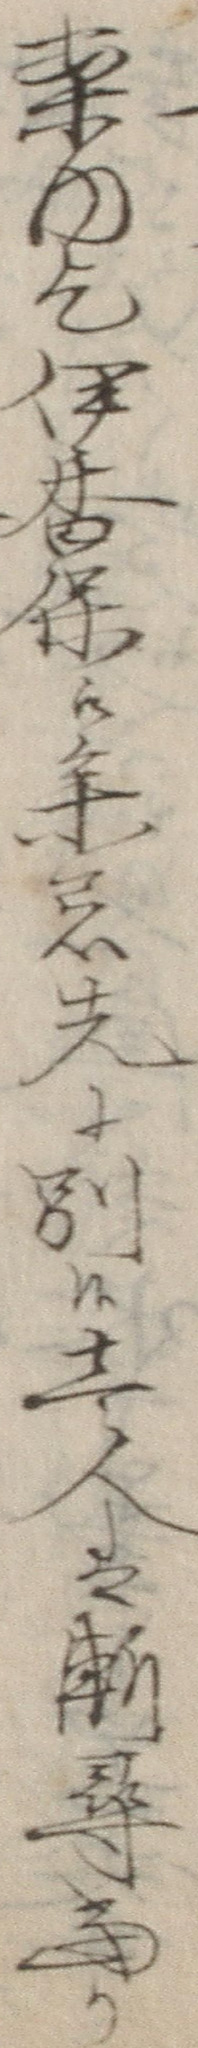案内乞伊香保江参着先に別候壱人は漸尋当り
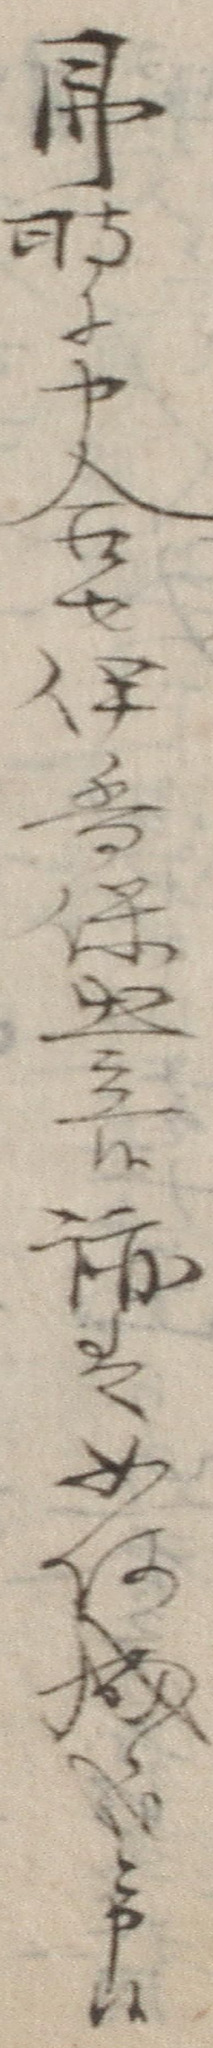帰時に申合セ伊香保出立候跡は如何成候哉と申候
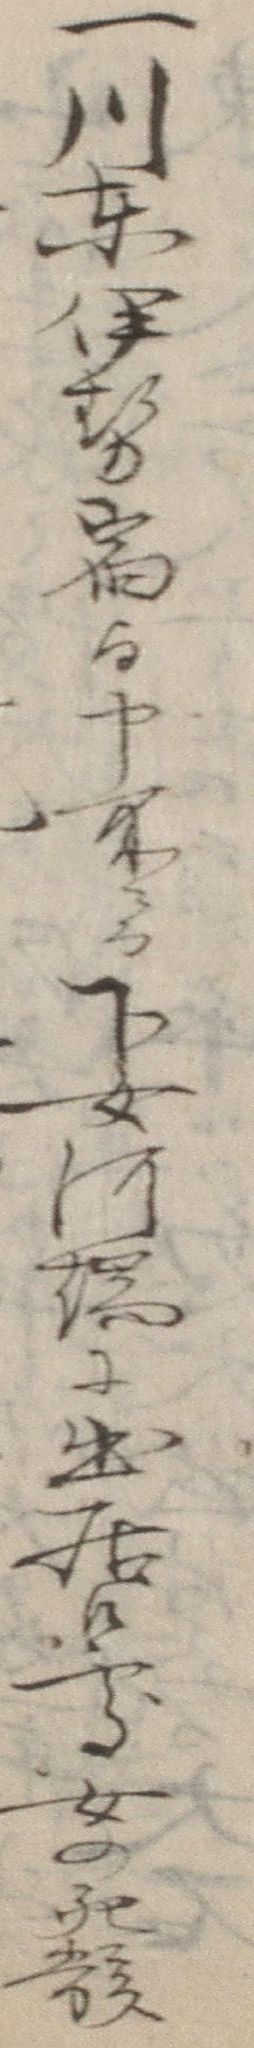一川東伊勢宿と申所ニ而下女河端に出居候処女の死骸
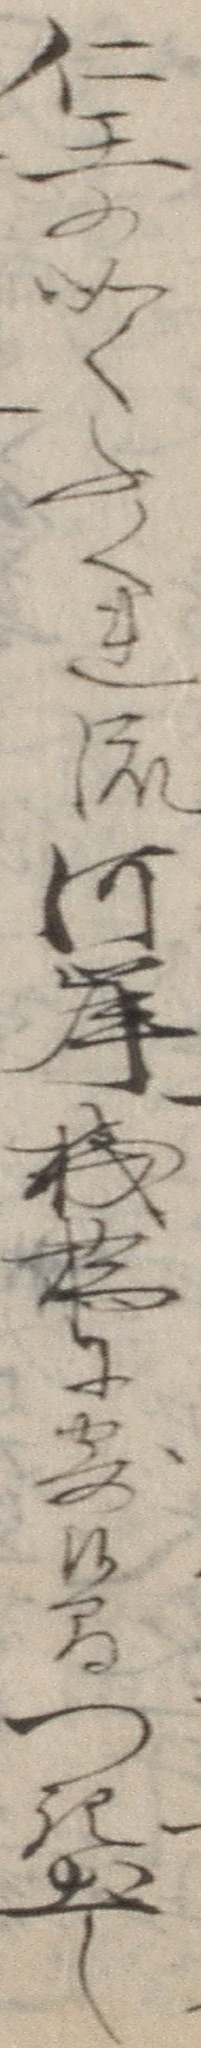仁王の如くふくれ流河岸桟橋に寄候間つき出し
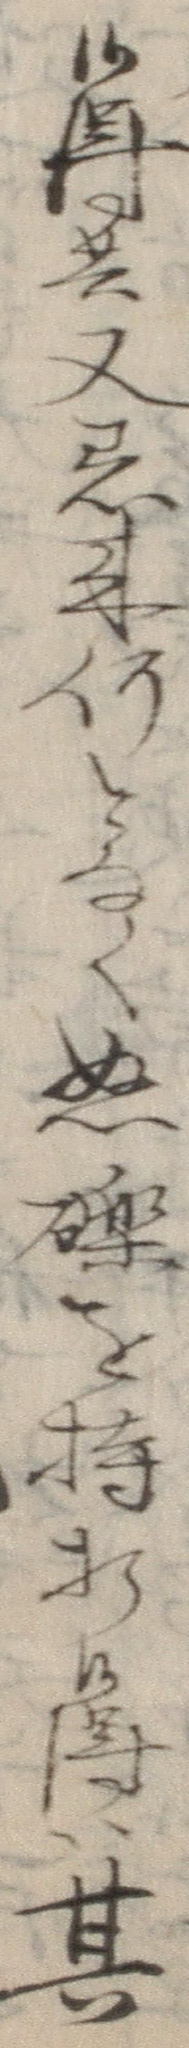候得共又着来何となく怒礫を持打候得ハ其
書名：[諸国災害記録]
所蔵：東京大学地震研究所図書室 Earthquake Research Institute Library, The University of Tokyo, JAPAN
